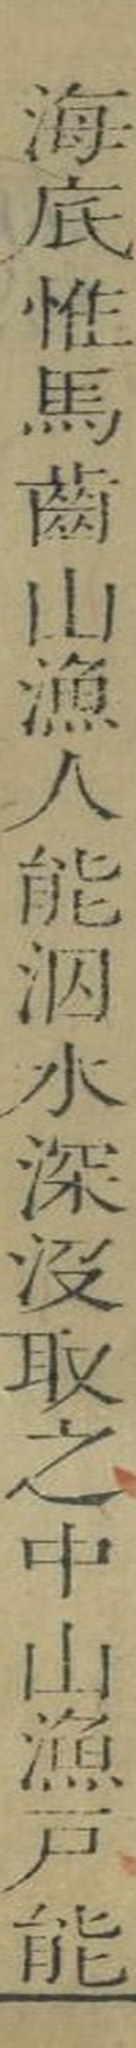海底惟馬歯山漁人能泅水深没取之中山漁戸能
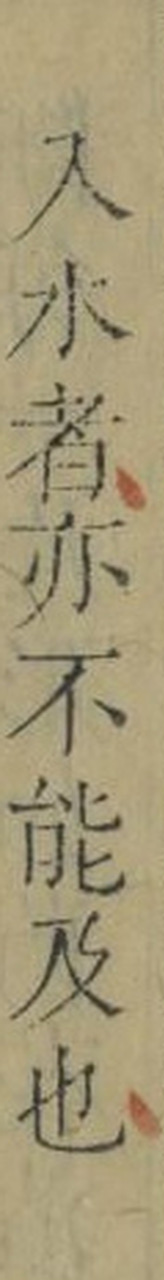入水者亦不能及也
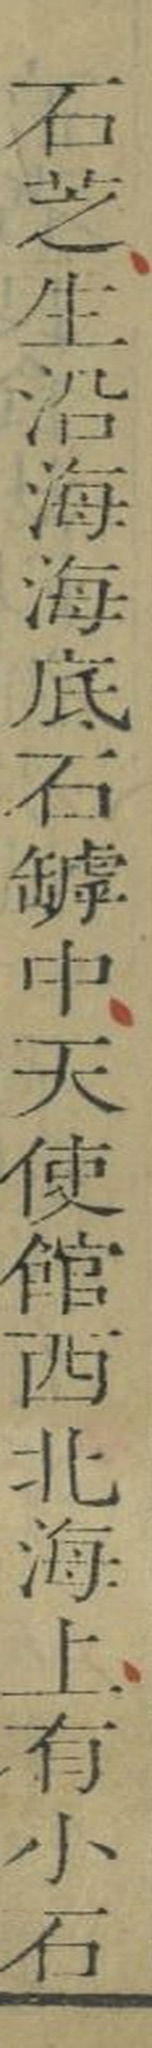石芝生沿海海底石罅中天使館西北海上有小石
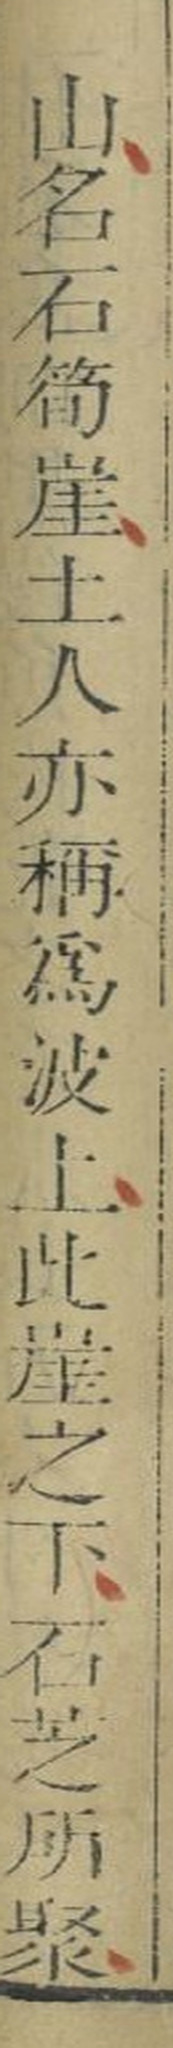山名石筍崖土人亦称為波上此崖之下石芝所聚
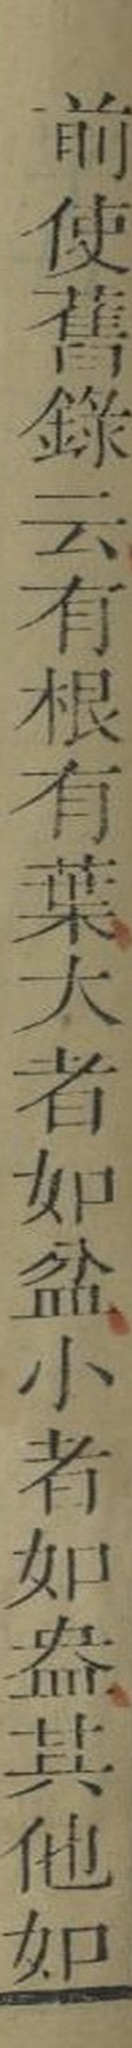前使旧録云有根有葉大者如盆小者如盎其他如
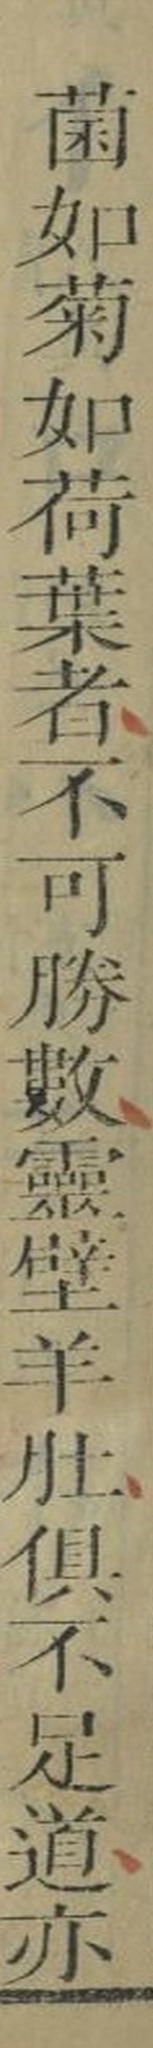菌如菊如荷葉者不可勝数霊壁羊肚俱不足道亦
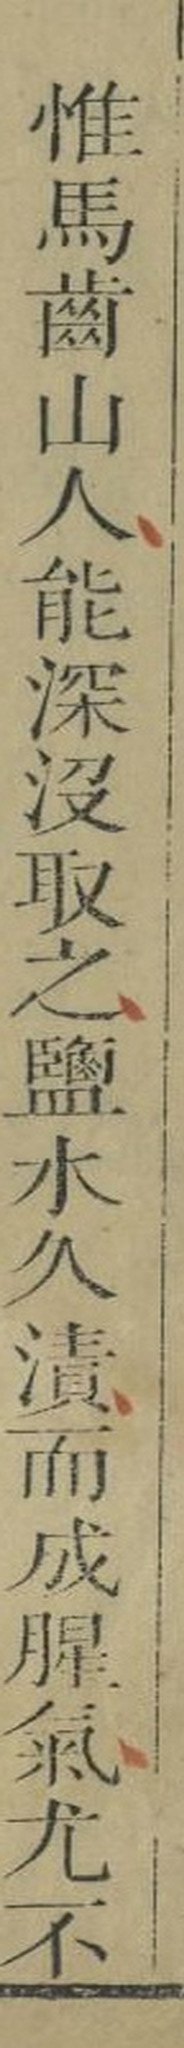惟馬歯山人能深没取之塩水久漬而成腥気尤不
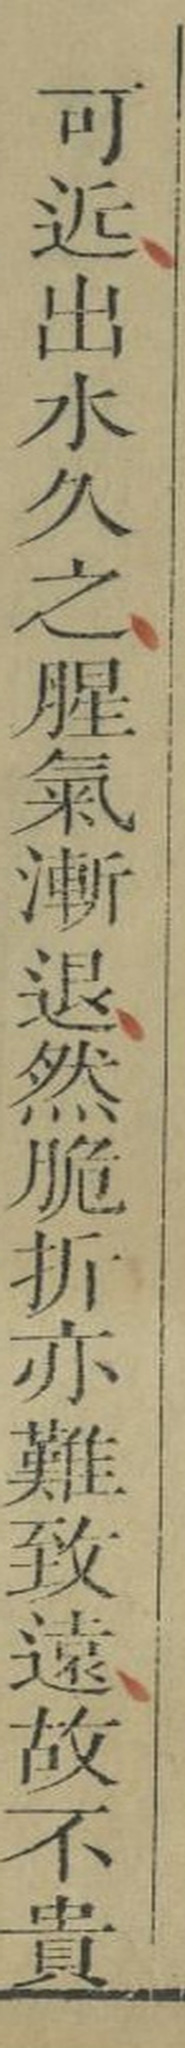可近出水久之腥気漸退然脆折亦難致遠故不貴
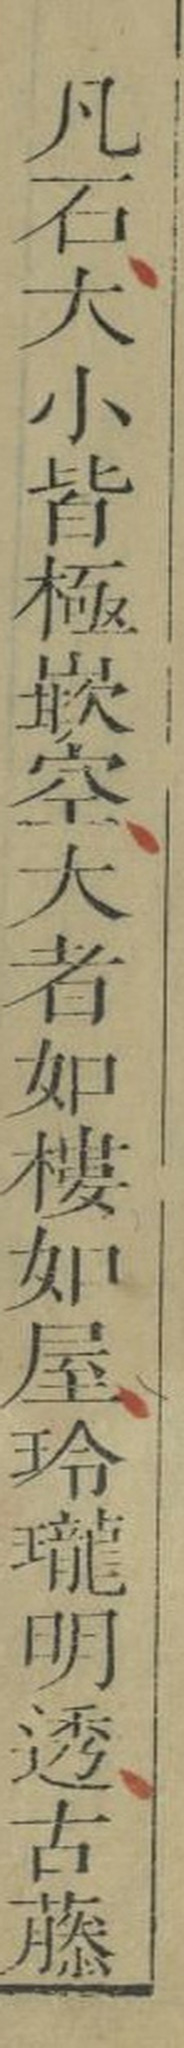凡石大小皆極嵌空大者如楼如屋玲瓏明透古藤
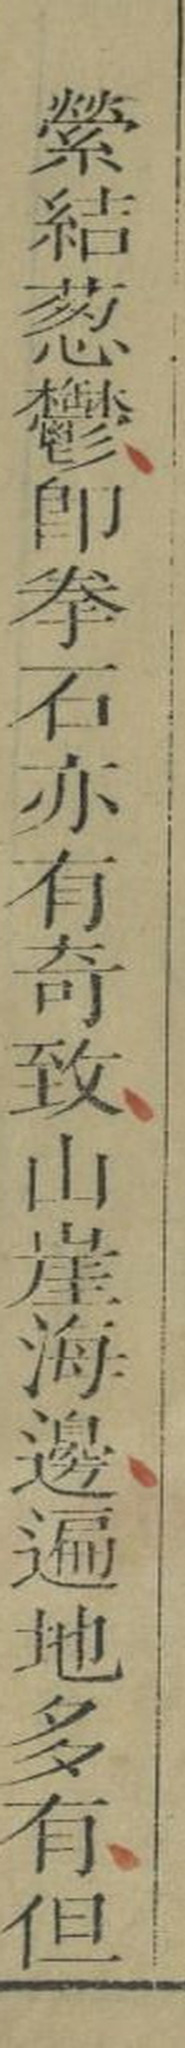縈結葱鬱即拳石亦有奇致山崖海辺遍地多有但
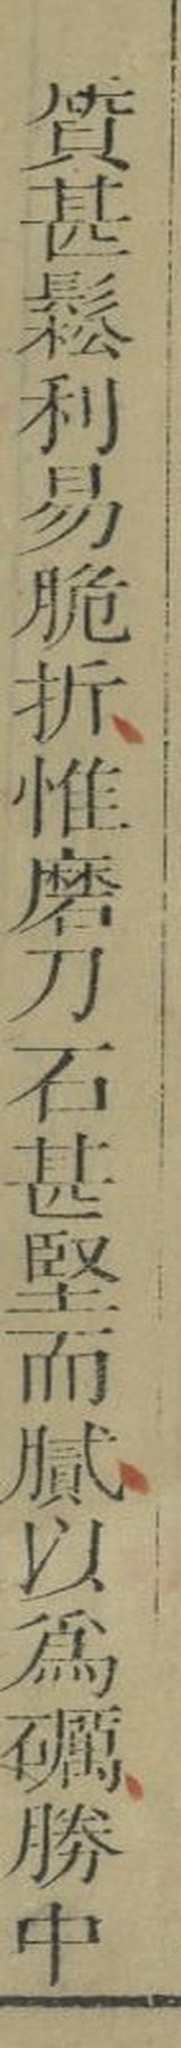質甚鬆利易脆折惟磨刀石甚堅而膩以為礪勝中
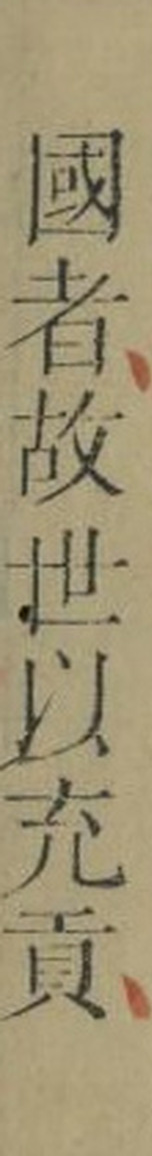国者故世以充貢

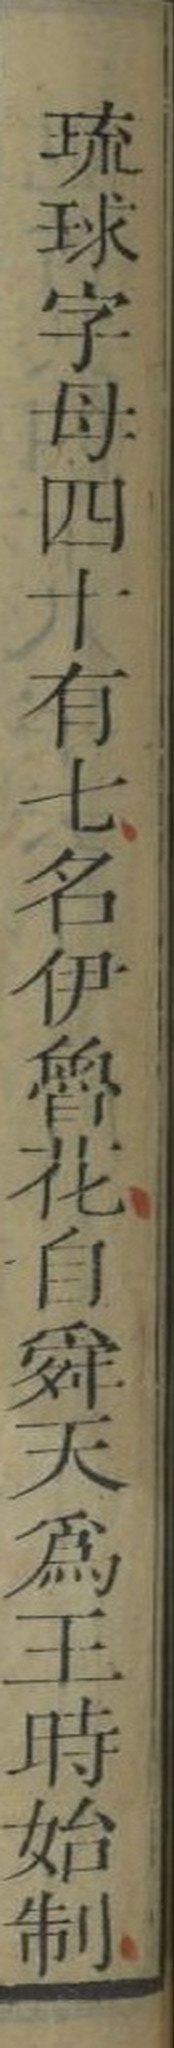琉球字母四十有七名伊魯花自舜天為王時始制
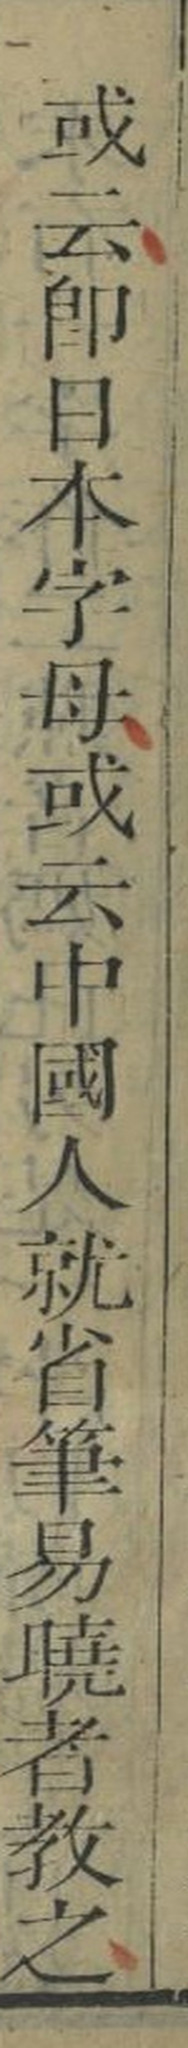或云即日本字母或云中国人就省筆易暁者教之
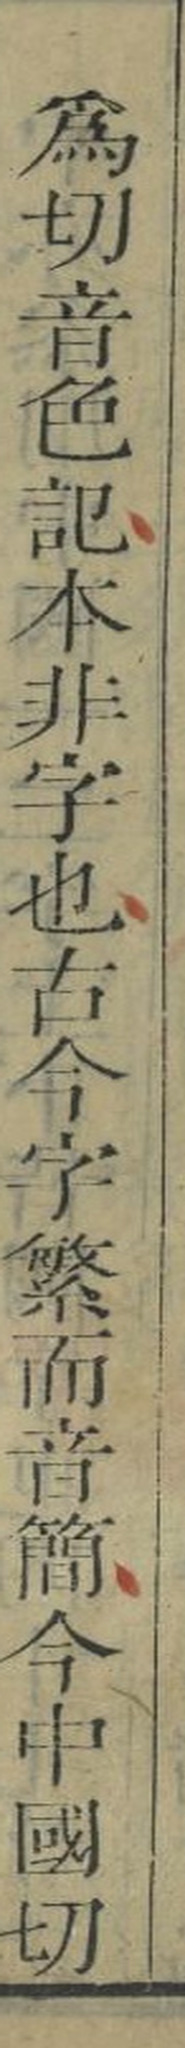為切音色記本非字也古今字繁而音簡今中国切
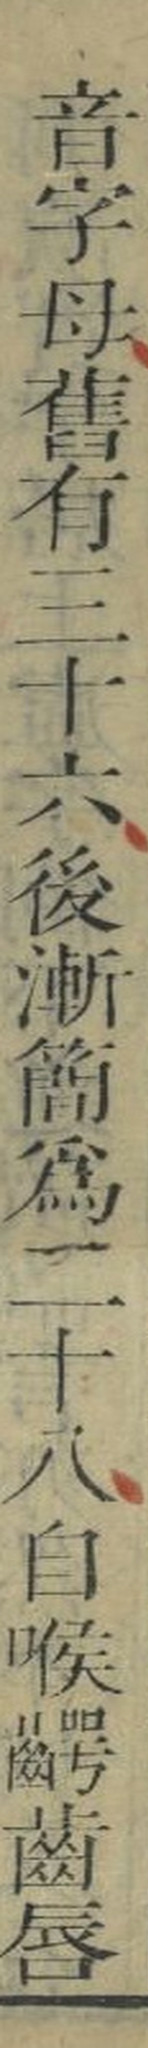音字母旧有三十六後漸簡為二十八自喉齶歯唇
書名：中山伝信録 巻六
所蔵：University of the Ryukyus Library
